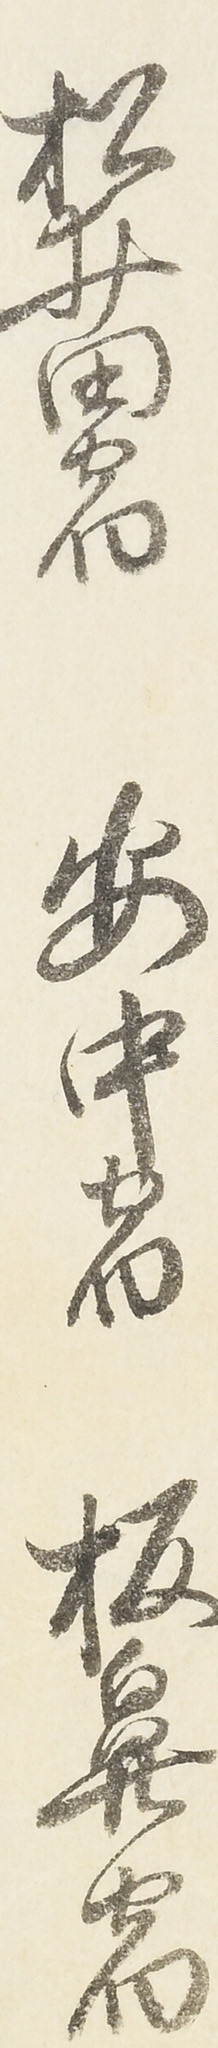松井田宿安中宿板鼻宿
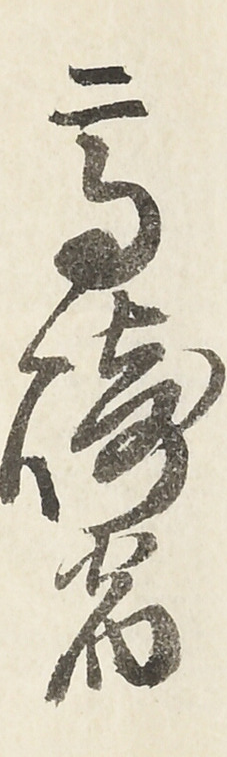高崎宿
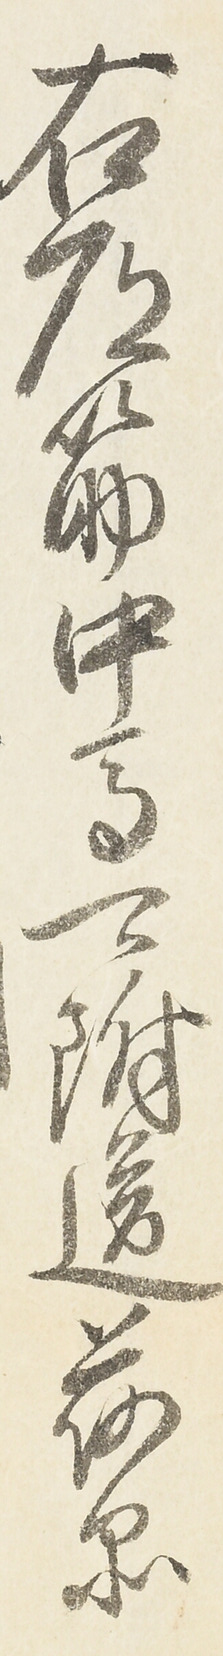右道筋中馬可附送荷品
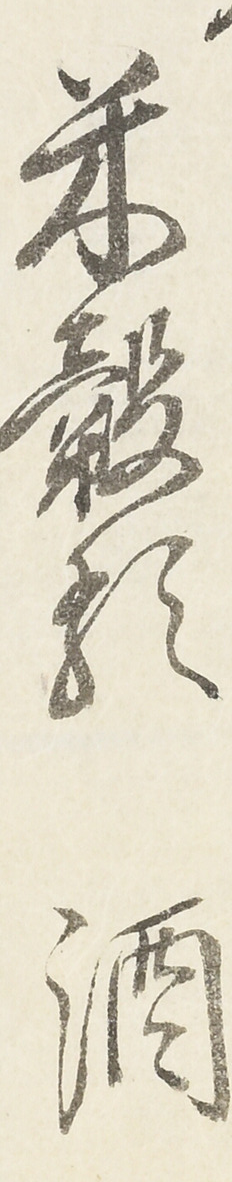米穀類酒
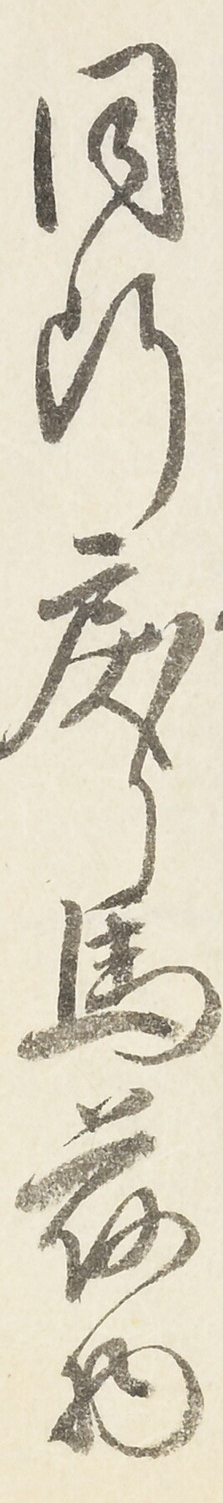同断戻り馬荷物

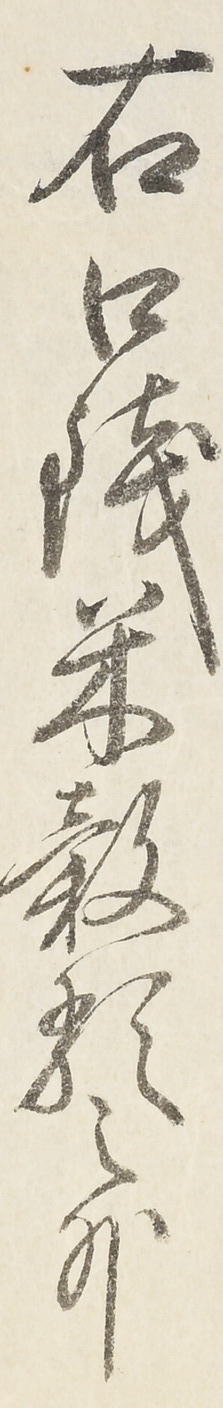右口銭米穀類之外
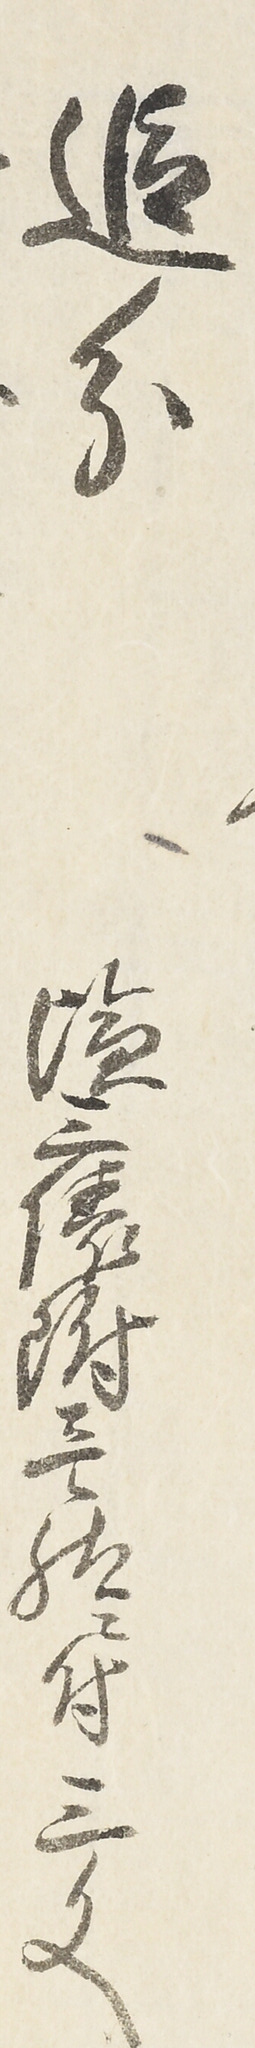追分塩三俵附壱駄ニ付三文
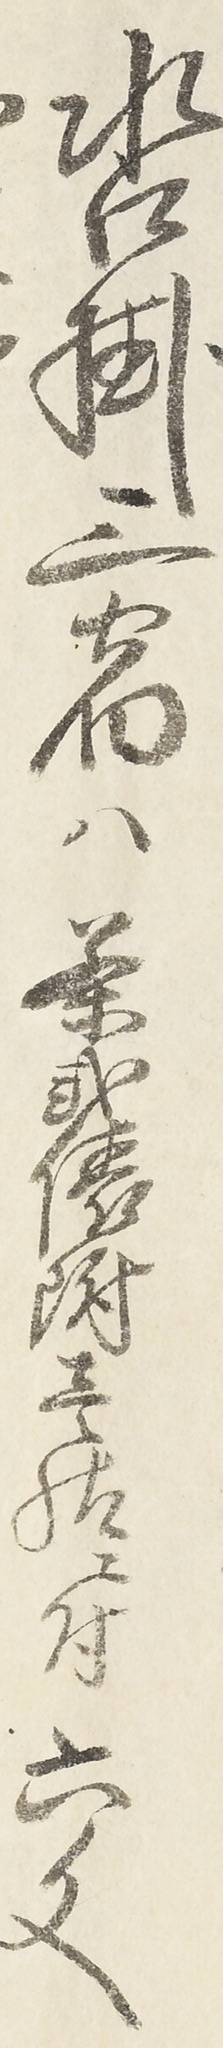沓掛三宿ハ茶弐俵附壱駄ニ付六文
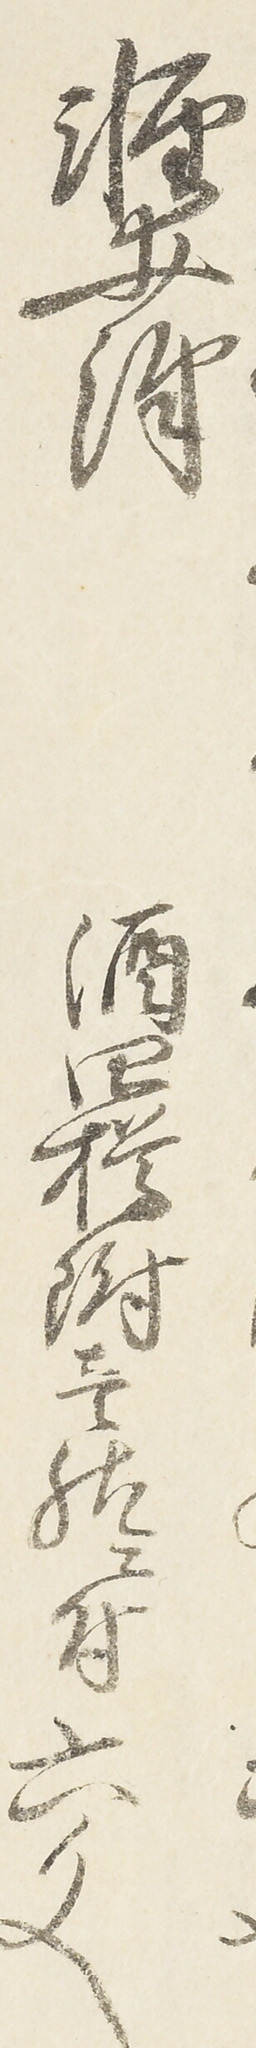軽井沢酒四樽附壱駄ニ付六文
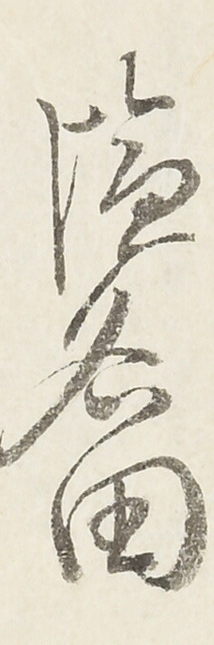塩名田
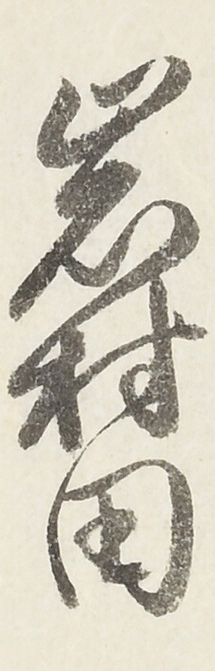岩村田
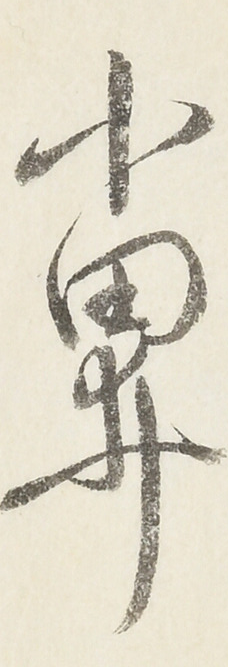小田井

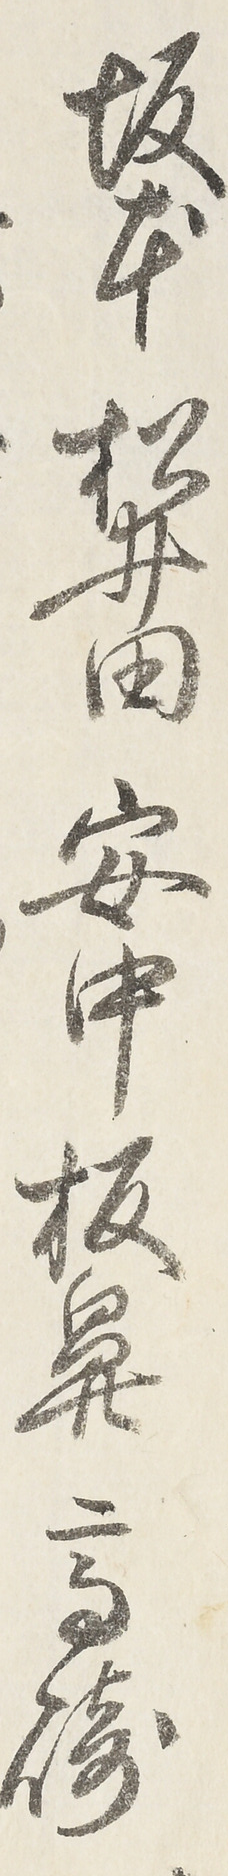坂本松井田安中板鼻高崎
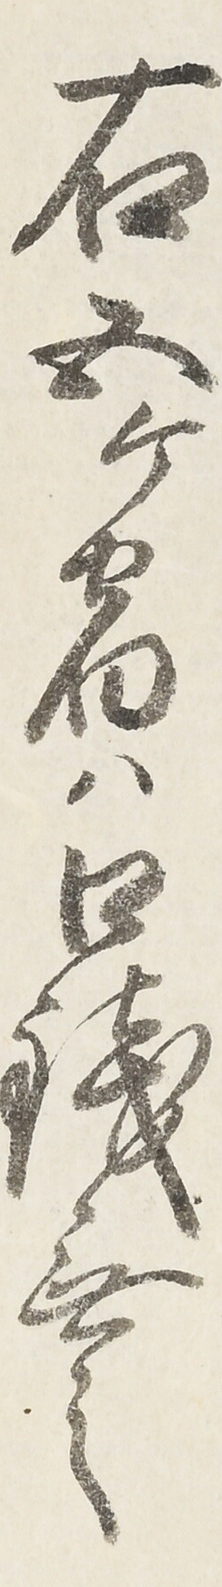右五ヶ宿ハ口銭無之
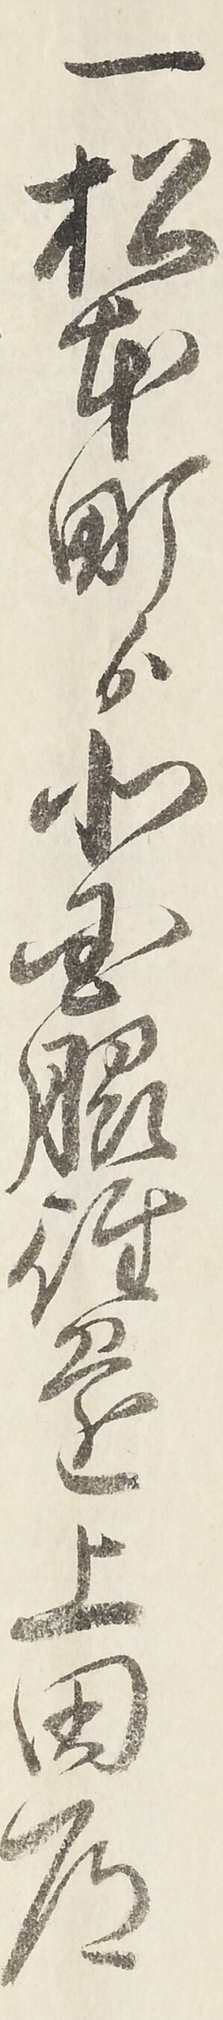一松本町ゟ北国脇往還上田道
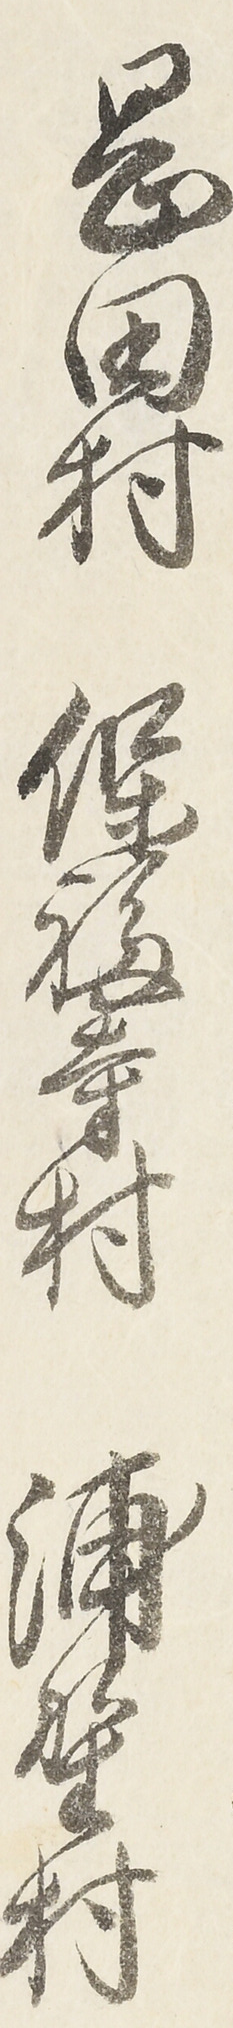岡田村保移寺村浦野村
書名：中馬御裁許帳面
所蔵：伊那市立高遠町図書館・合同会社AMANE
